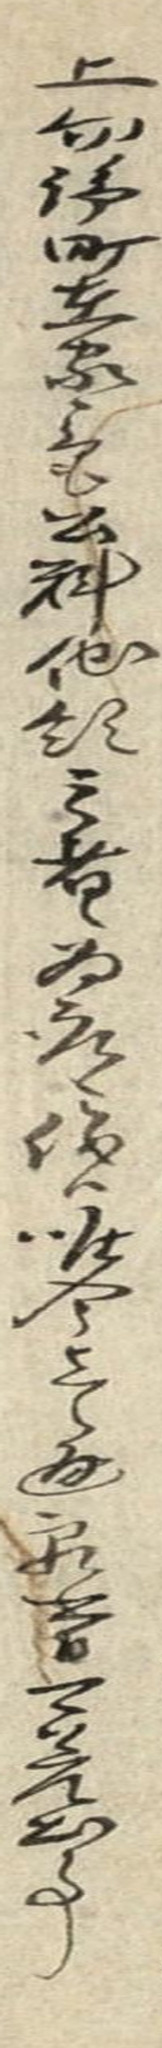上勿論町在家ニ而も公料他領之者へ為取候儀ハ唯今迄之通り願書付可差出事
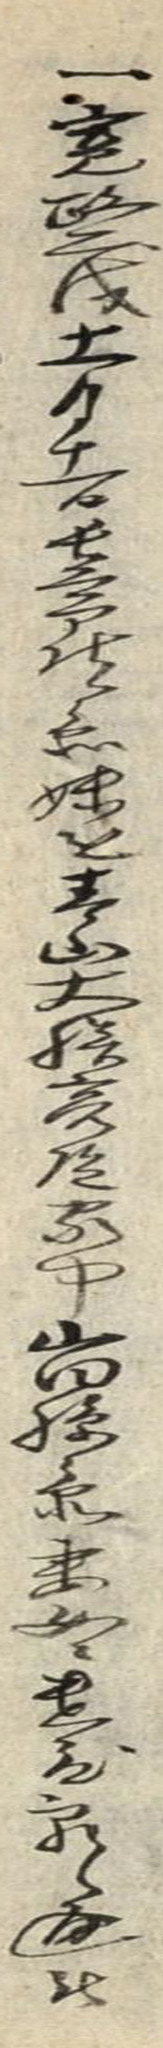一寛政二戌十一月十一日長谷部次郎兵衛妹を青山大膳亮殿家中山田孫兵衛妻女ニ遣度願之通被
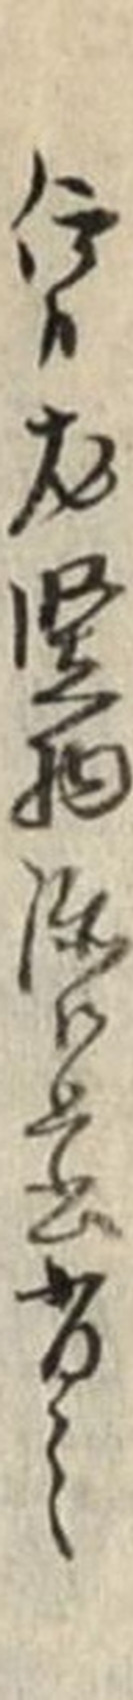仰付尤竪物添口上書有之
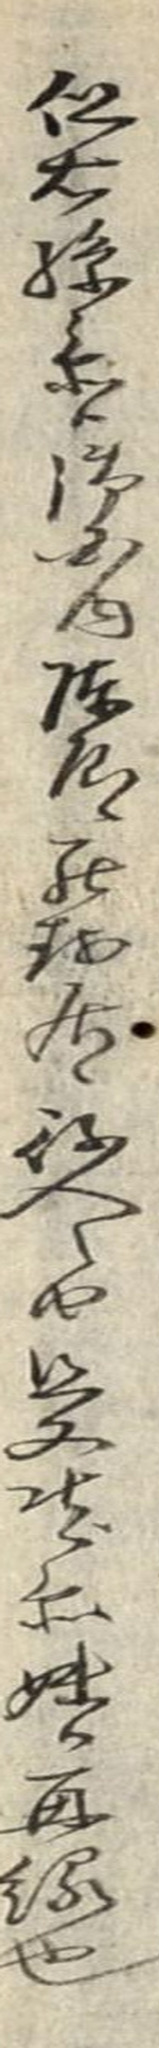但右孫兵衛ニ御国内陣屋へ罷越居候役人之由且又次郎兵衛妹ハ再縁也
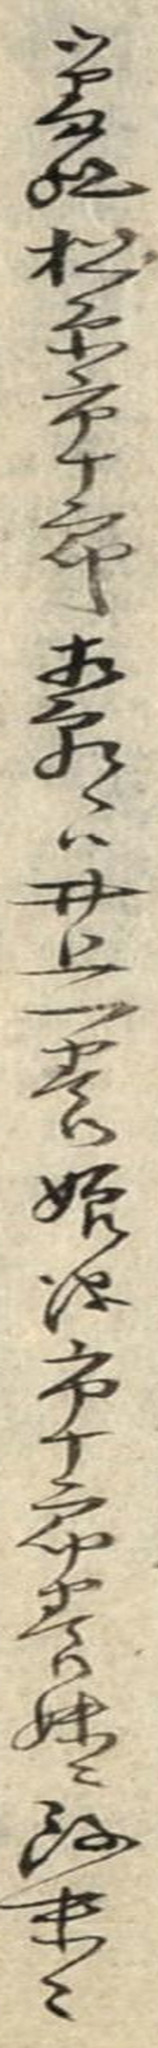一御番組松原市十郎相願候ハ井上一養娘儀市十郎養妹ニ致末々
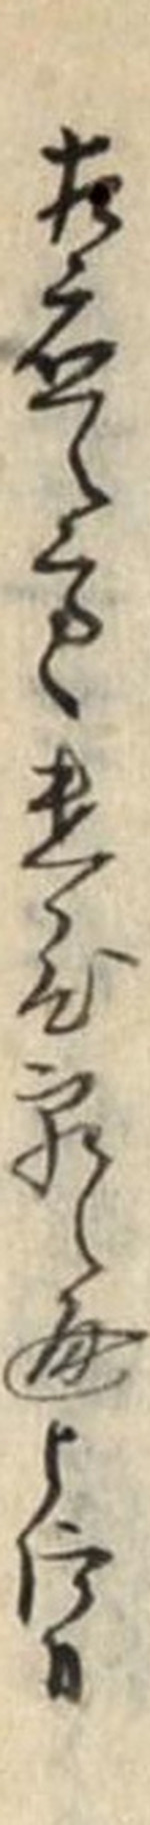相応之方へ遣度願之通被仰付

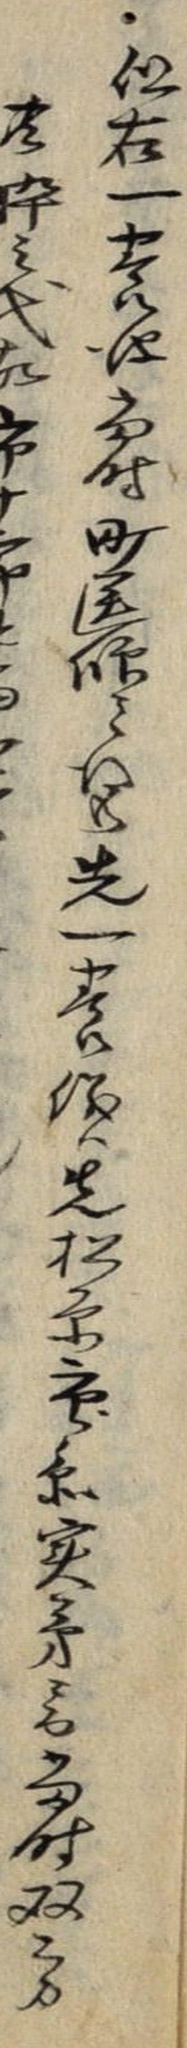但右一養儀当時町医師ニ候得共先一養儀ハ先松原市郎兵衛実弟二而当時双方
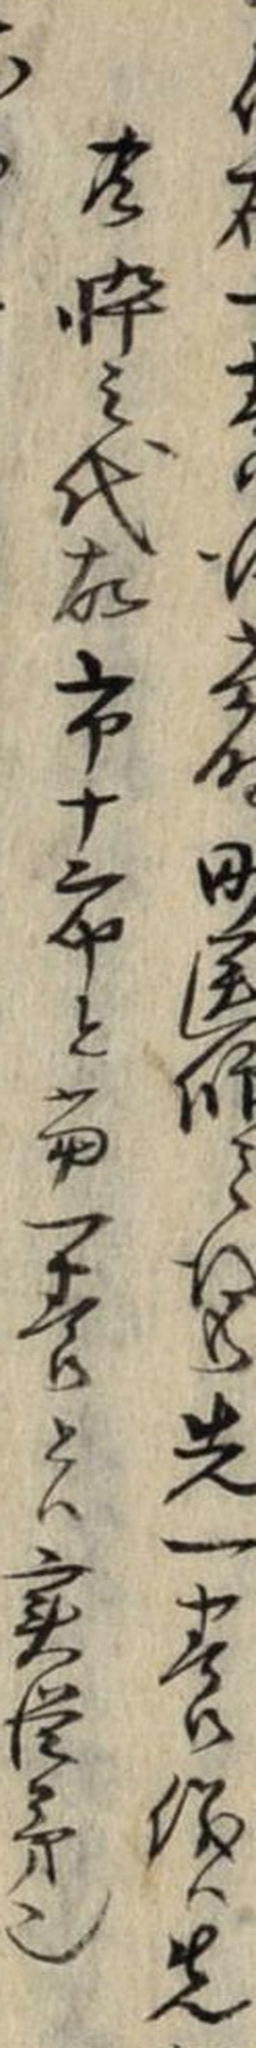共悴之代故市十郎と当一養とハ実従弟也
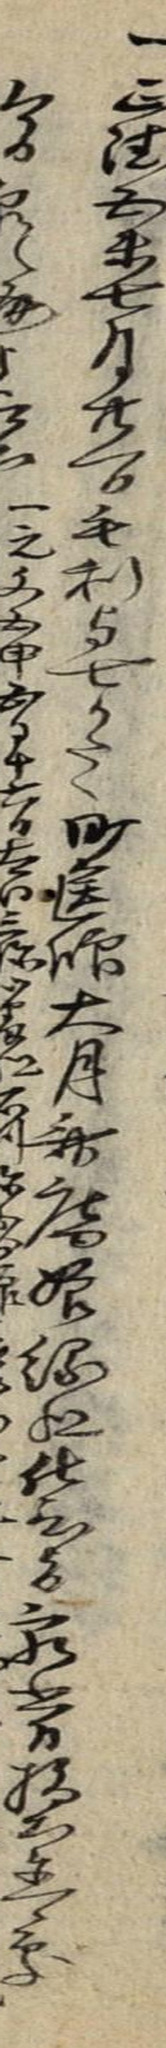一正徳五未七月廿一日毛利与七かたへ町医師大月斎庵娘縁組仕度旨願書付指出置候処
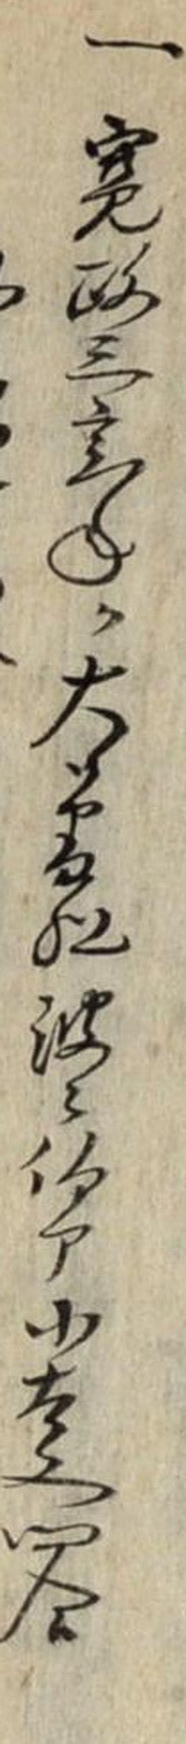一寛政三亥年ヵ大御番組波々伯部小太夫問合
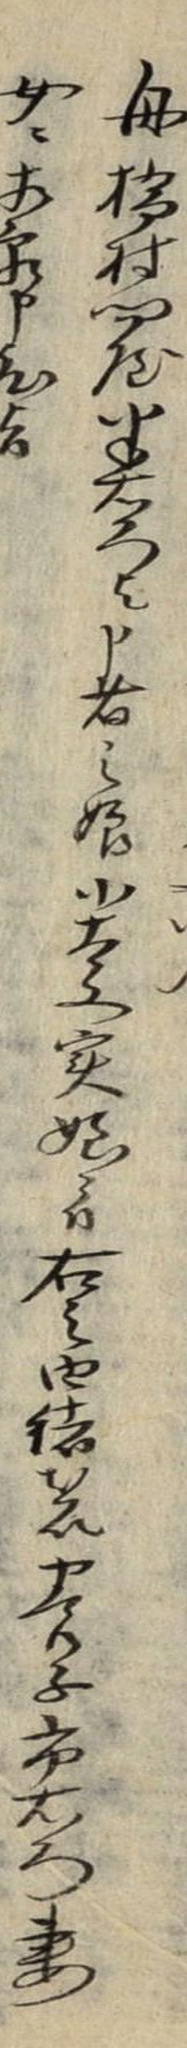舟橋村問屋半右衛門と申者之娘小太夫実娘ニ付右之由緒を以養子市右衛門妻
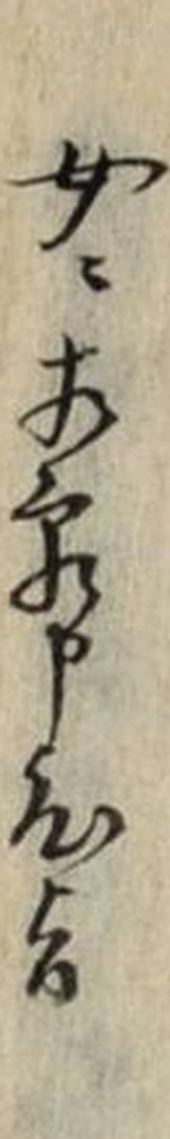女ニ相願申度旨
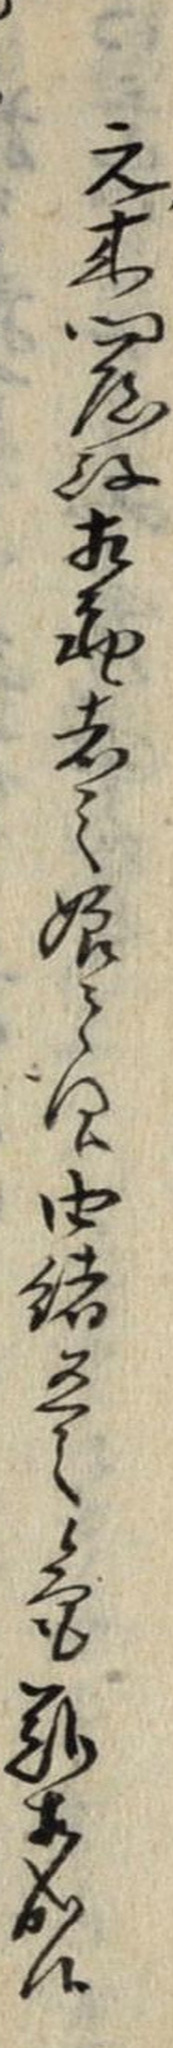元来問屋役相勤候者之娘ニ候得ハ由緒有之候而も難相成候
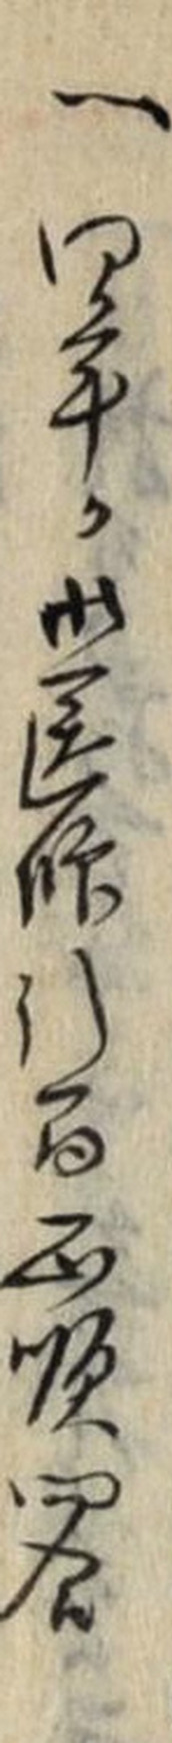一同年ヵ御医師引間正順問合
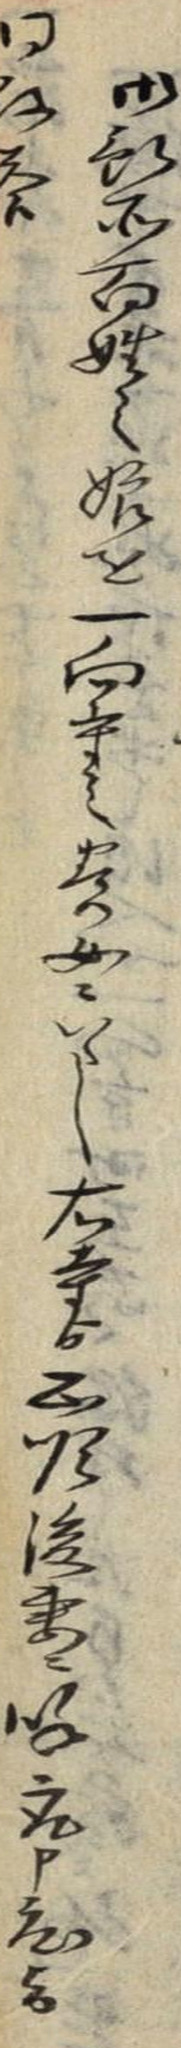御預所百姓之娘を一向寺之養女ニいたし右寺ゟ正順後妻ニ呼取申度旨
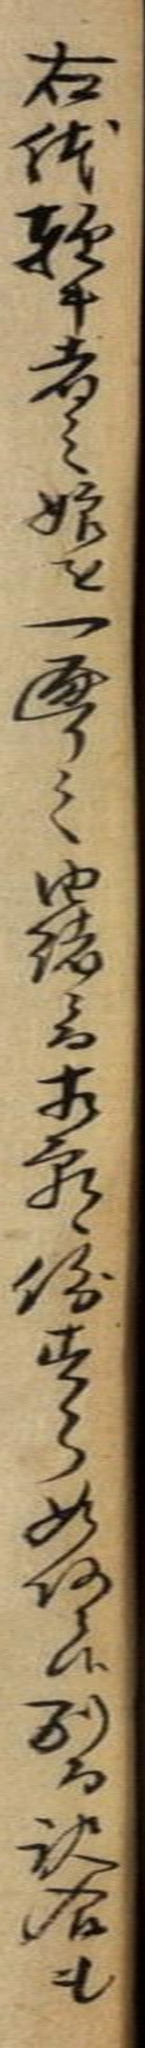右体軽キ者之娘を一通り之由緒に而相願候儀すら如何二候別而訳合も
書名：養子縁組之部
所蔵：福井県文書館 Fukui Prefectural Archives
